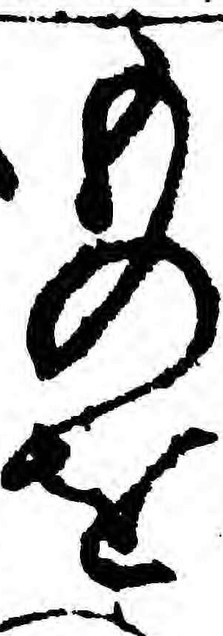ものを
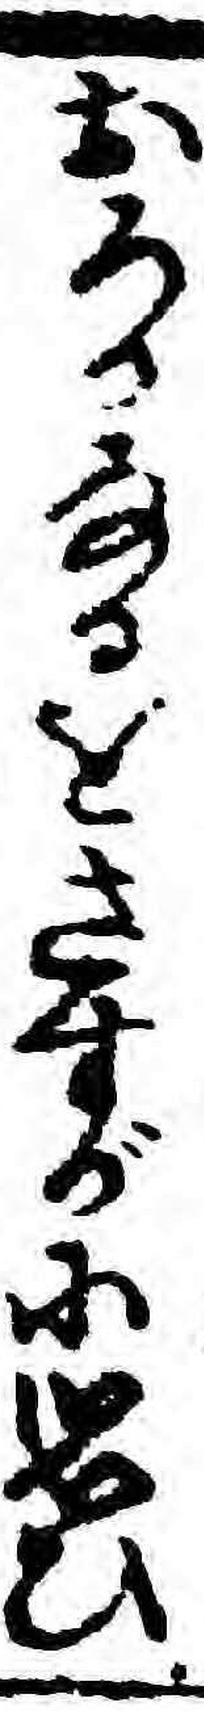おろかなるをさすがに思ひ
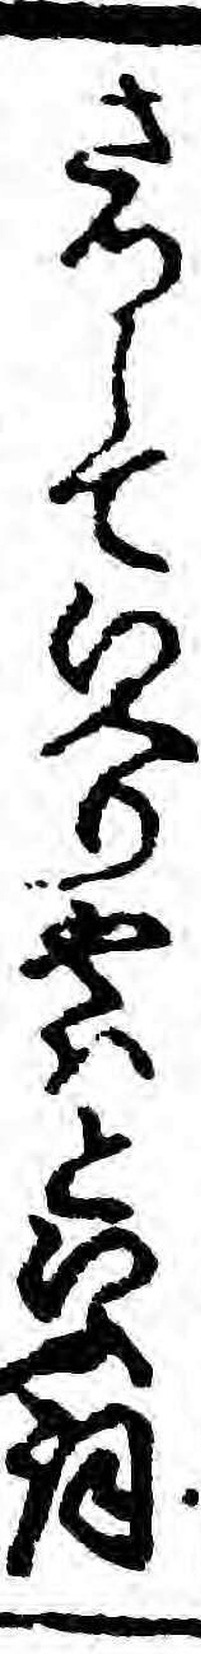さつしていへりやはといふ詞
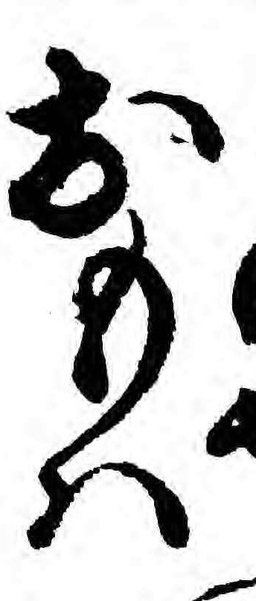おもは
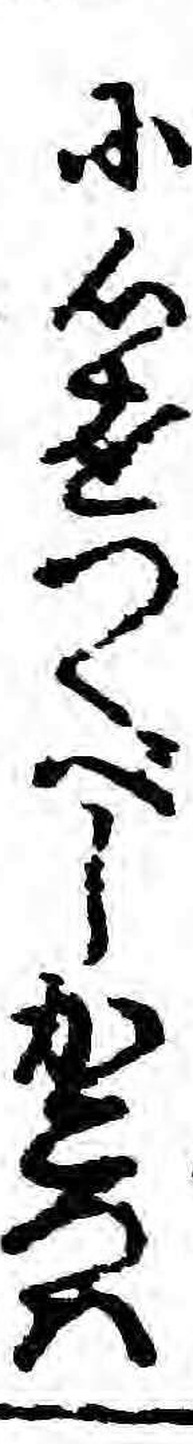に心をつくべしかこつは
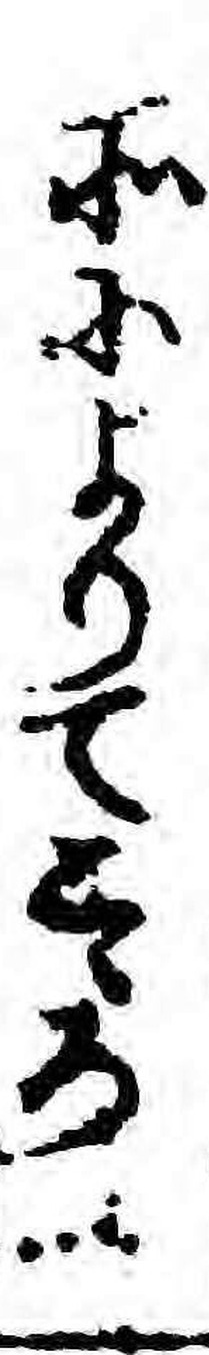所によりてこゝろ
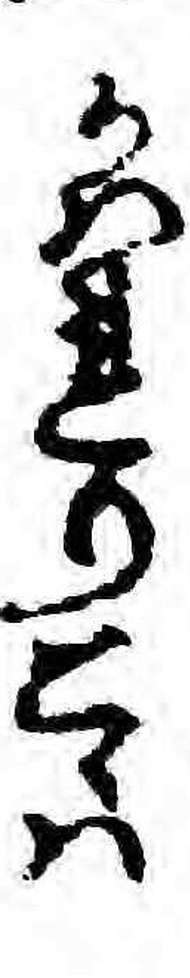かはれりこゝは
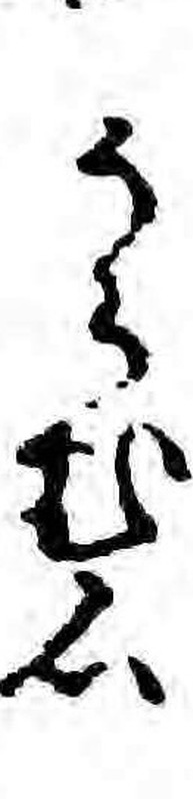うらむ心
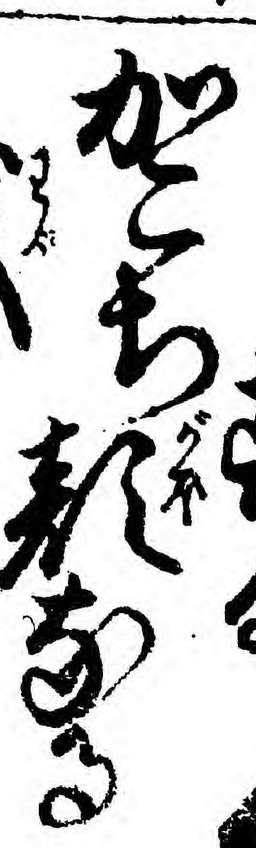かこち顔なる
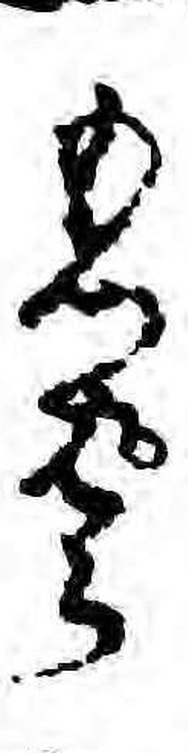もつぱら
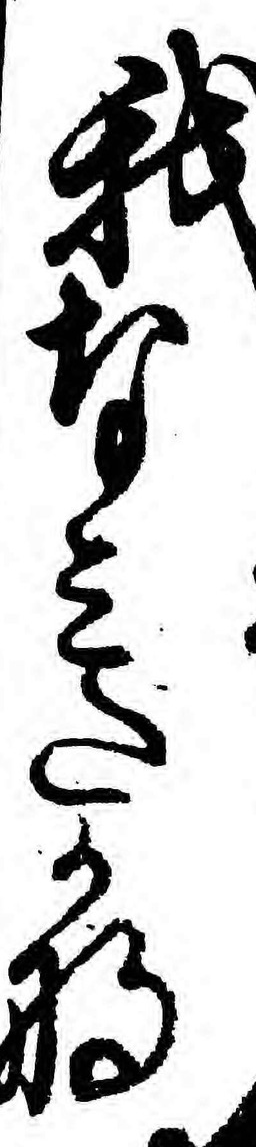我なみだかな
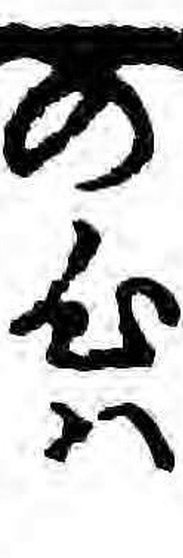の心は
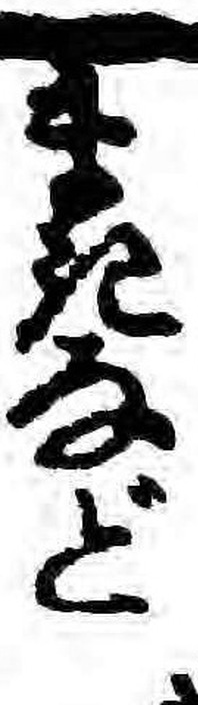まきなど
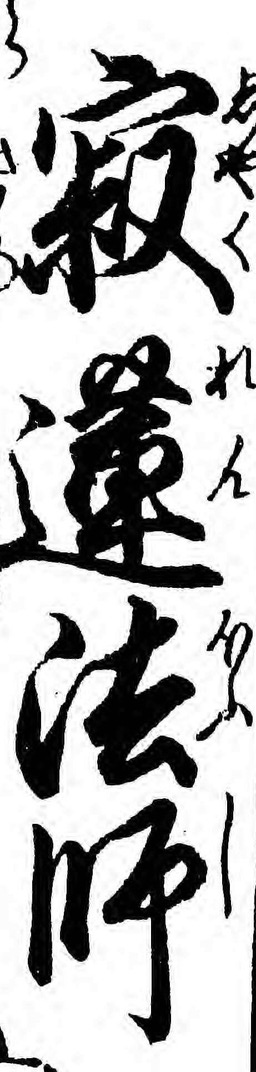寂蓮法師
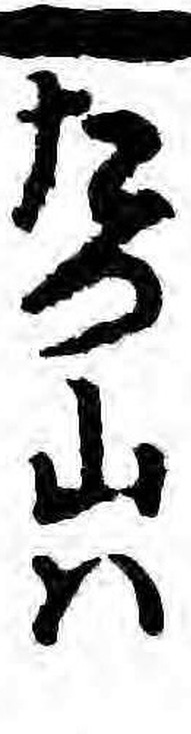たつ山は
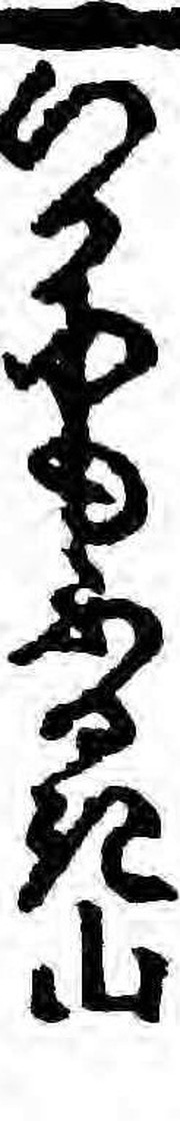いかにもふるき山
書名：頭書和歌注譯／壽賀多百人一首小倉錦
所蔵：国文学研究資料館
